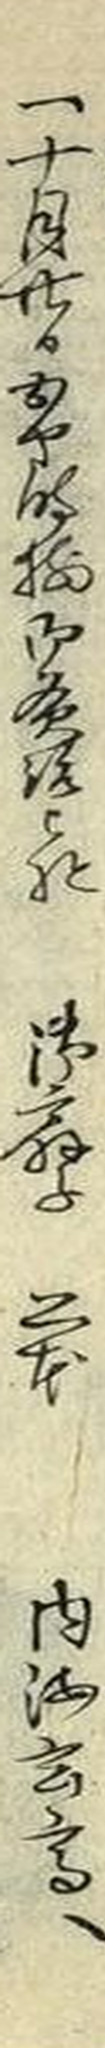一十月廿日五半時揃御灸治被遊御扇子二本内海玄高へ
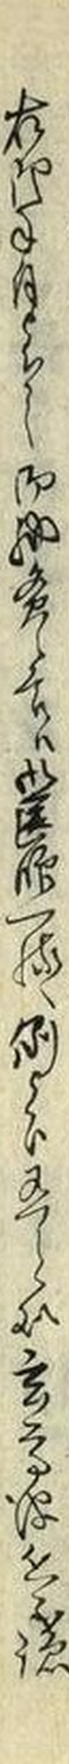右御手自被下之御納灸之節ハ御医師一統へ例被下有之候処玄高儀近々謙
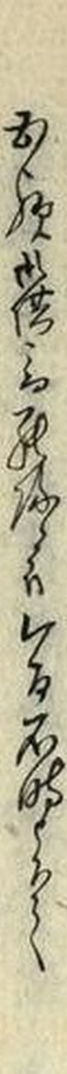五郎様御供ニ而罷帰候ニ付今日不時被下之
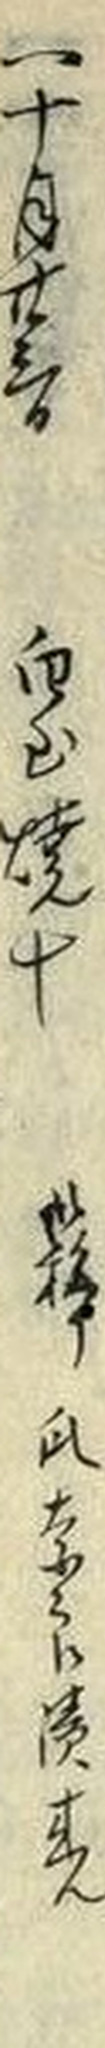一十月廿三日白玉焼十御移り瓜なら漬来ㇽ
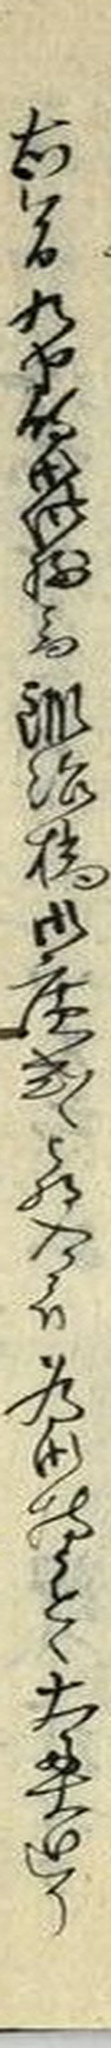右今日九半時御供揃ニ而鍛冶橋御広式へ被為入候ニ付為御持被進候大奥廻り
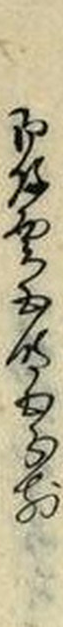御帰殿五時五分前
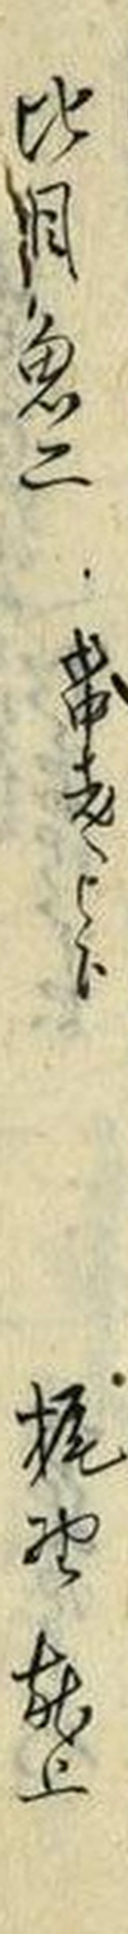比目魚二御中老へ被下梶野献上

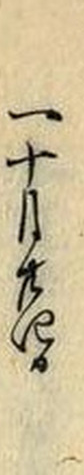一十月廿四日
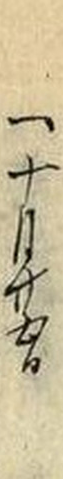一十月廿五日
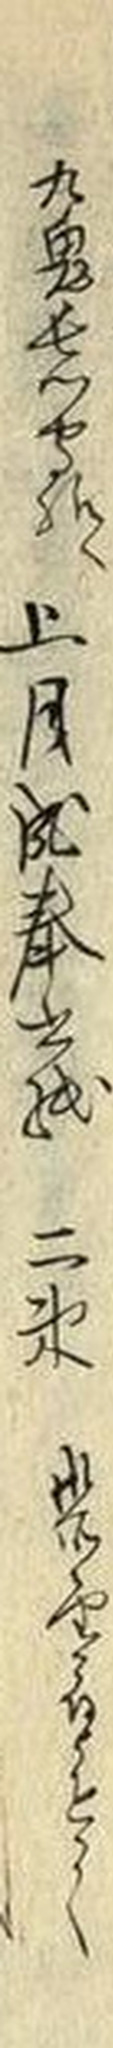九鬼長門守様へ上月成奉書紙二束御所望ニ付被進之
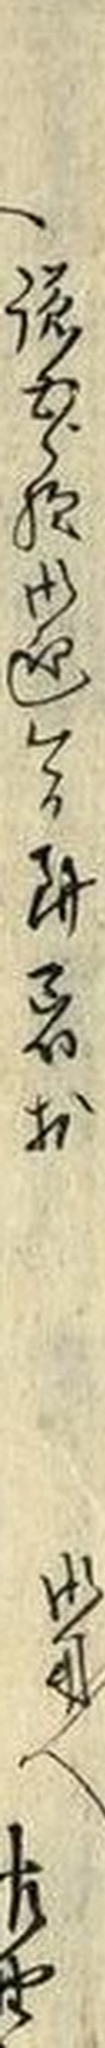謙五郎様御迎今日到着於御用人
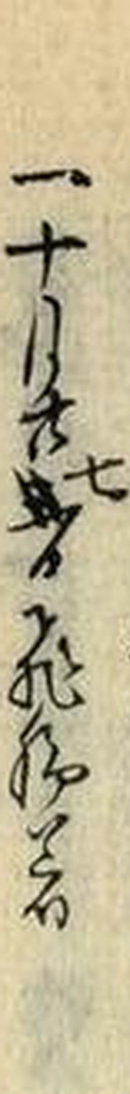一十月廿七日飛脚着
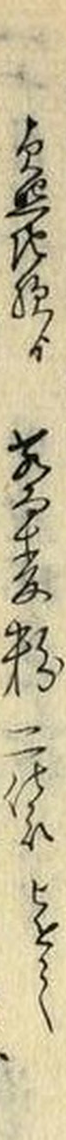貞照院様ゟ蕎麦粉二袋被進之
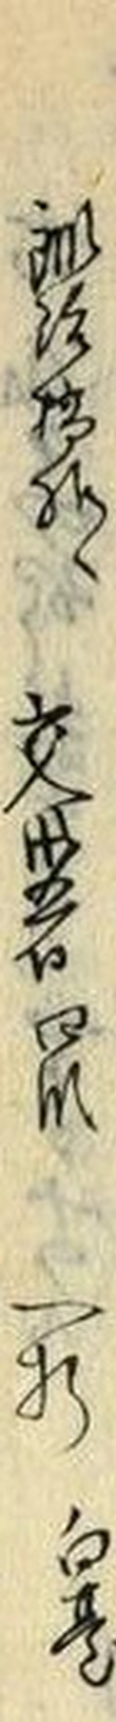鍛冶橋様へ交御肴四段一折白台
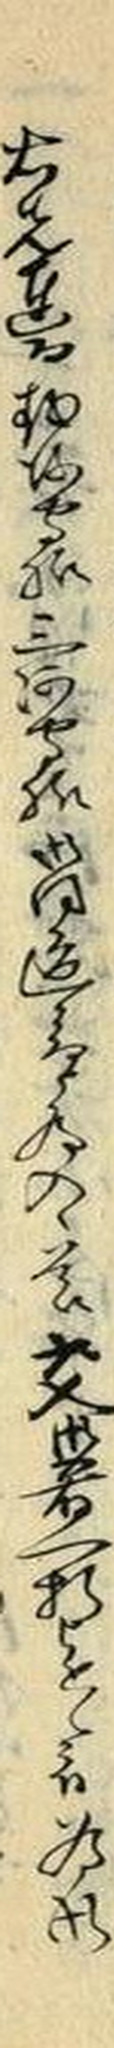右先達而越後守様三河守様御同道ニ而被為入候節交御肴一折被進候ニ付為御
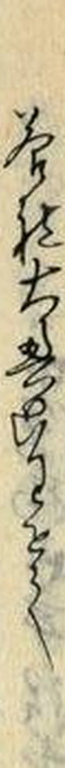答礼大奥廻り被進之
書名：少傅日録抄（斉承付側向頭取日記、在府）
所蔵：福井県文書館 Fukui Prefectural Archives
